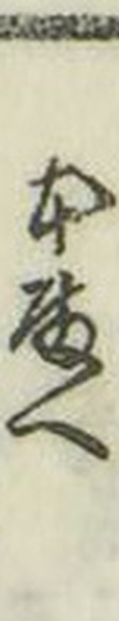本殿へ
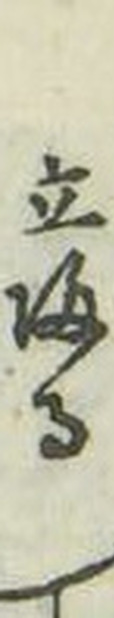立返る

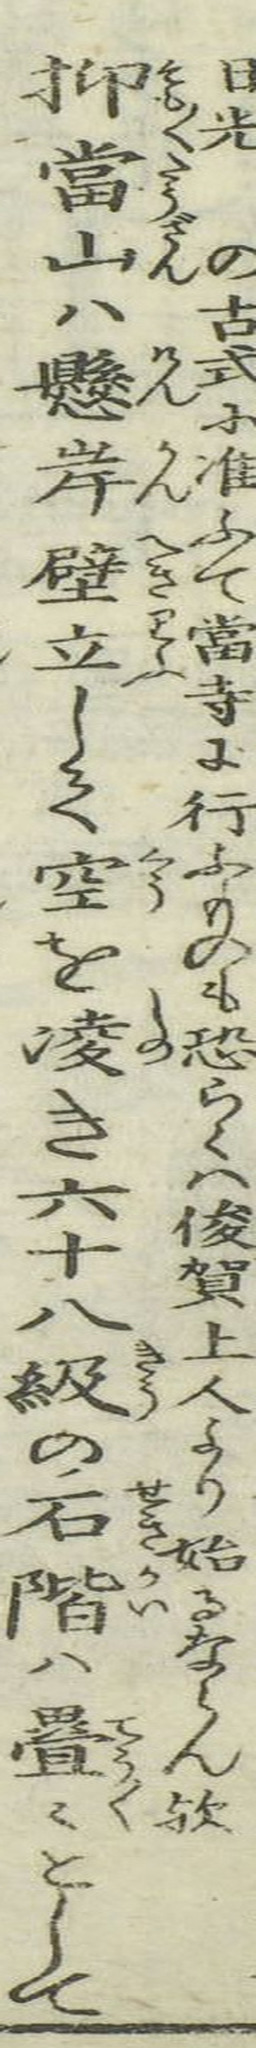抑當山は懸岸壁立して空を凌き六十八級の石階は畳々として
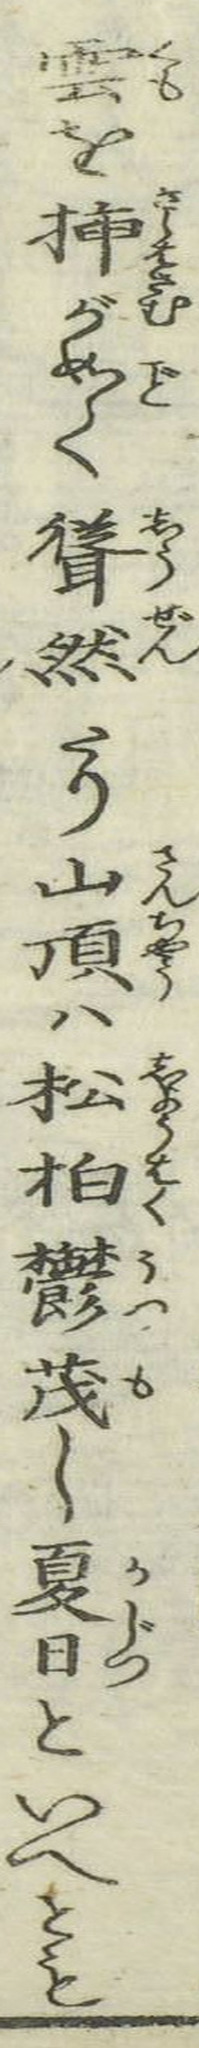雲を挿が如く聳然たり山頂は松柏欝茂し夏日といへとも
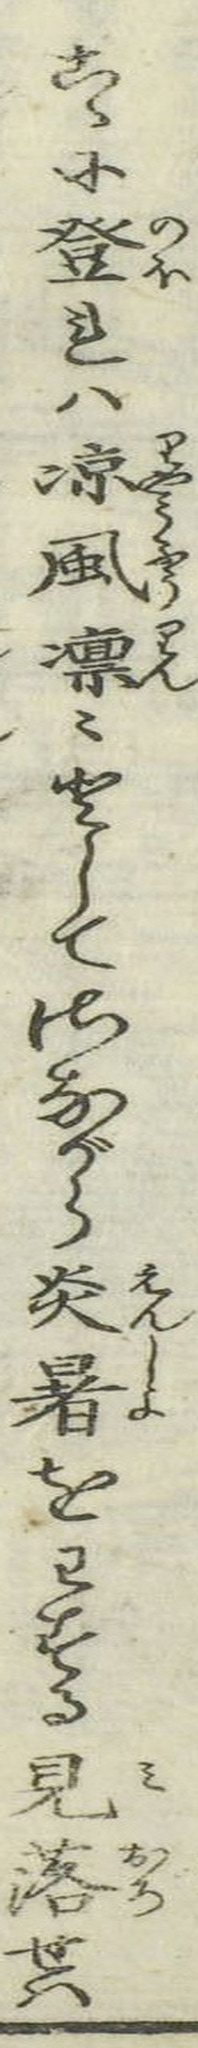こゝに登れは涼風凛々としてさながら炎暑をわする見落せは
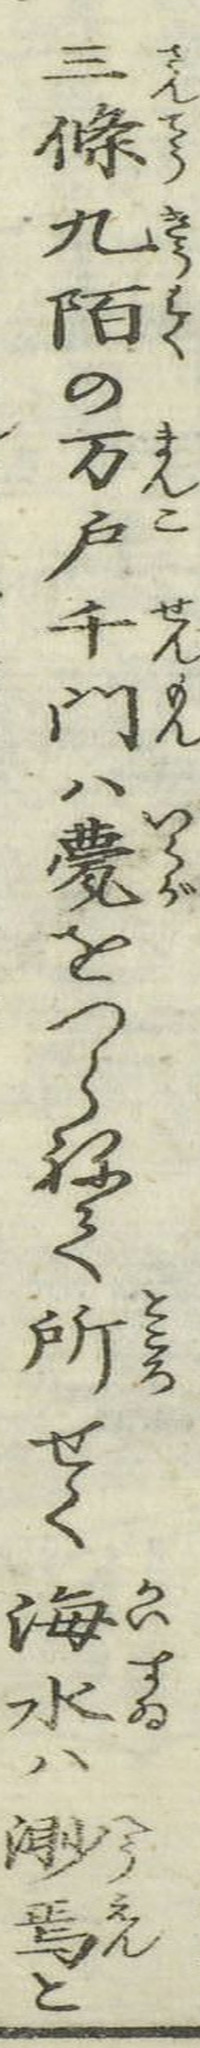三條九陌の万戸千門は甍をつらねて所せく海水は渺焉と
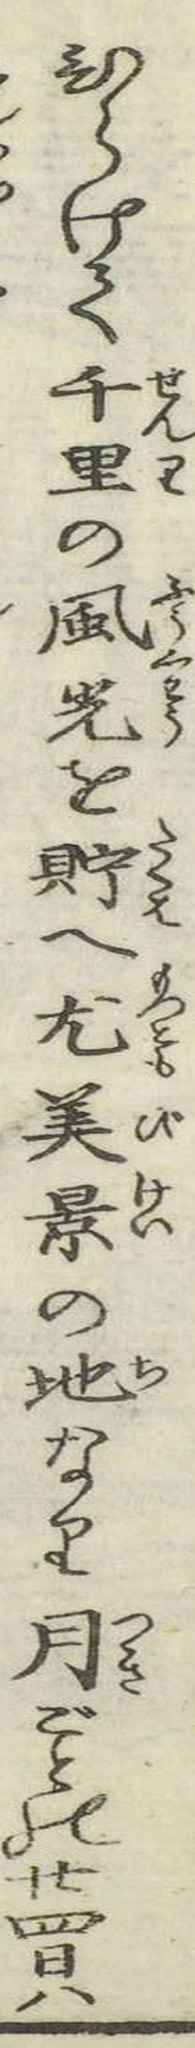ひらけて千里の風光を貯へ尤美景の地なり月ごとの廿四日は
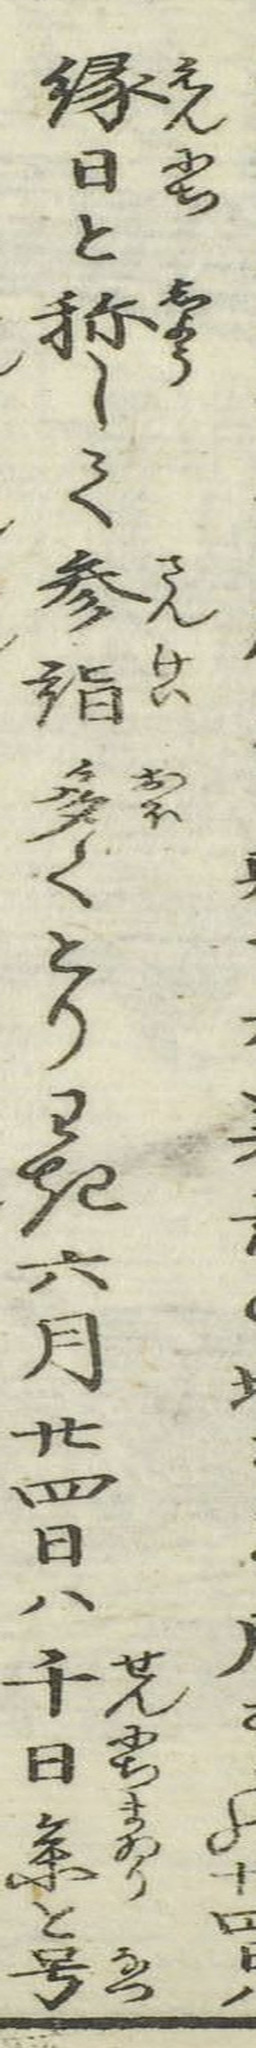縁日と称して参詣多くとりわき六月二十四日は千日参と号
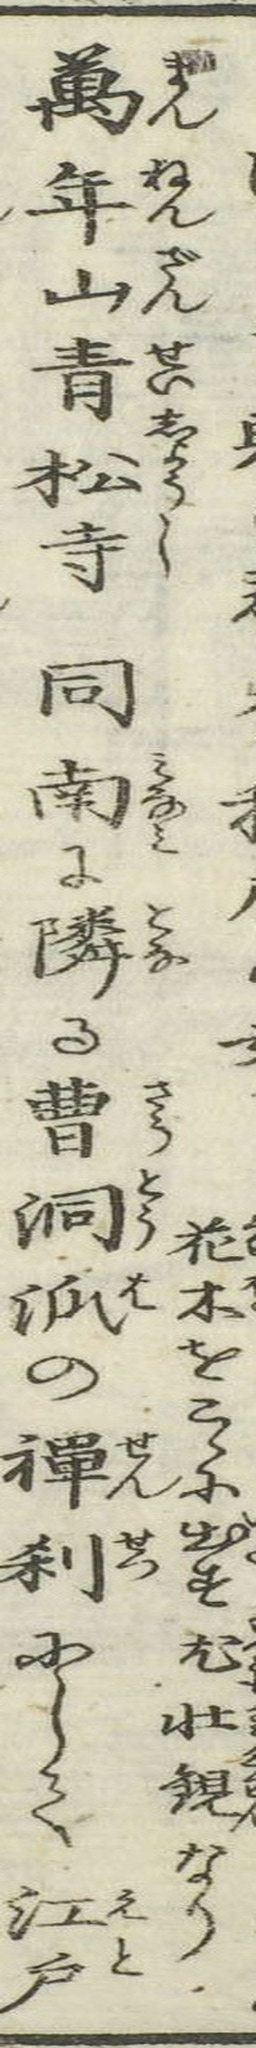萬年山青松寺同南に隣る曹洞派の禅刹にして江戸
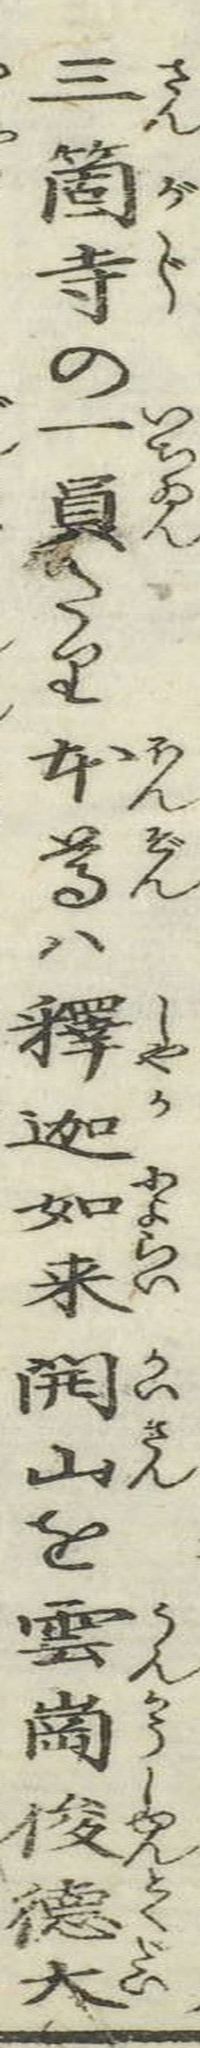三箇寺の一員たり本尊は釈迦如来開山を雲崗俊徳大
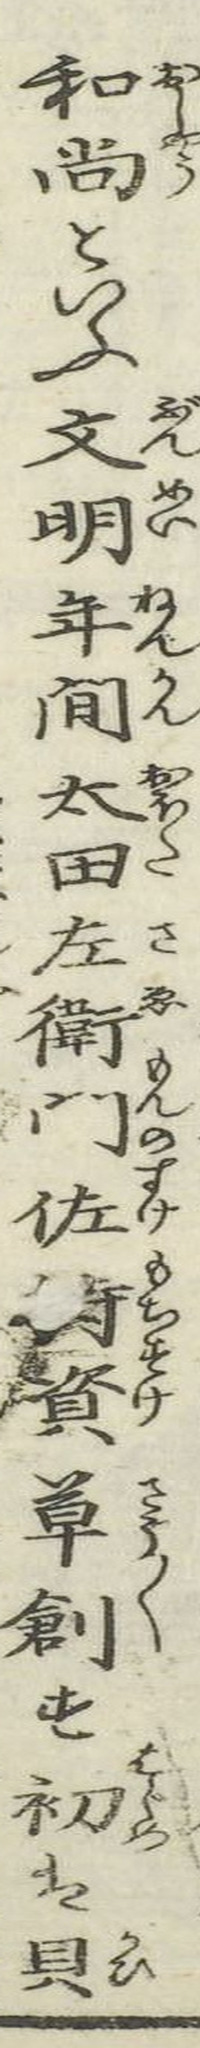和尚といふ文明年間太田左衛門佐持資草創す初は貝
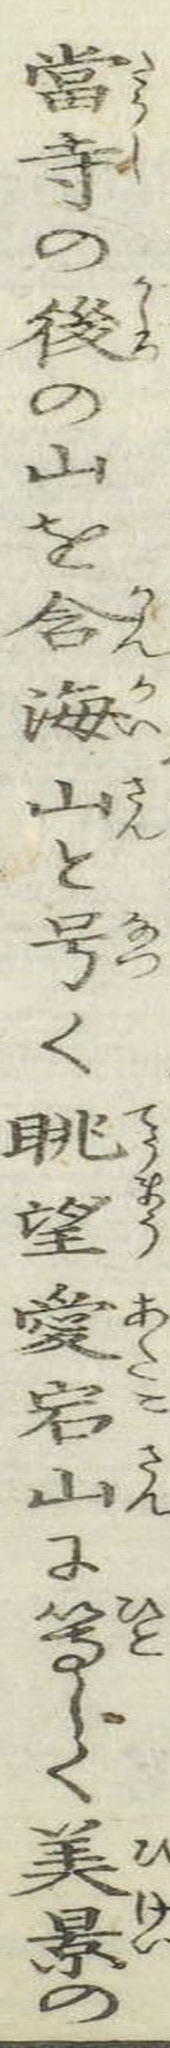當寺の後の山を含海山と号く眺望愛宕山に等しく美景の
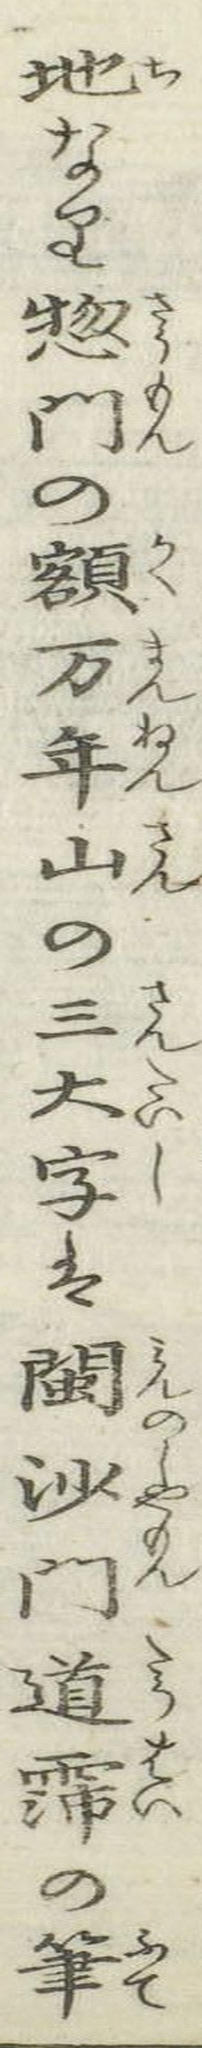地なり惣門の額万年山の三大字は閩沙門道霈の筆
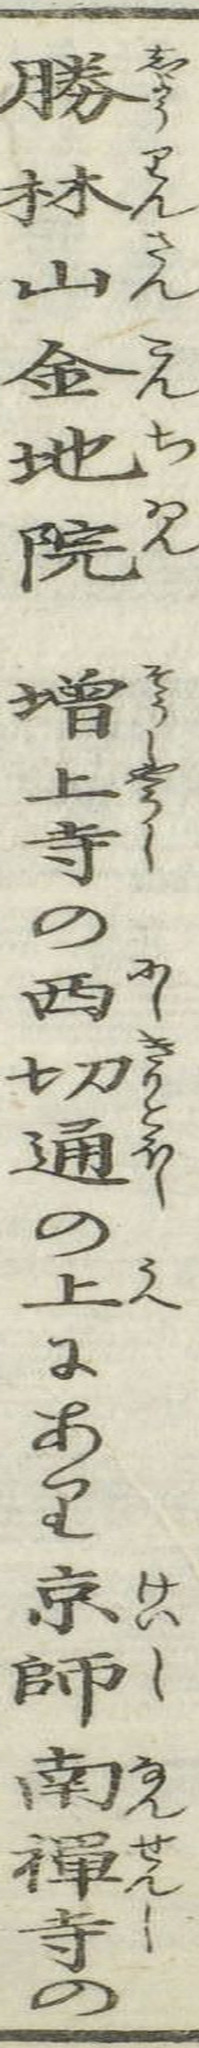勝林山金地院増上寺の西切通の上にあり京師南禅寺の
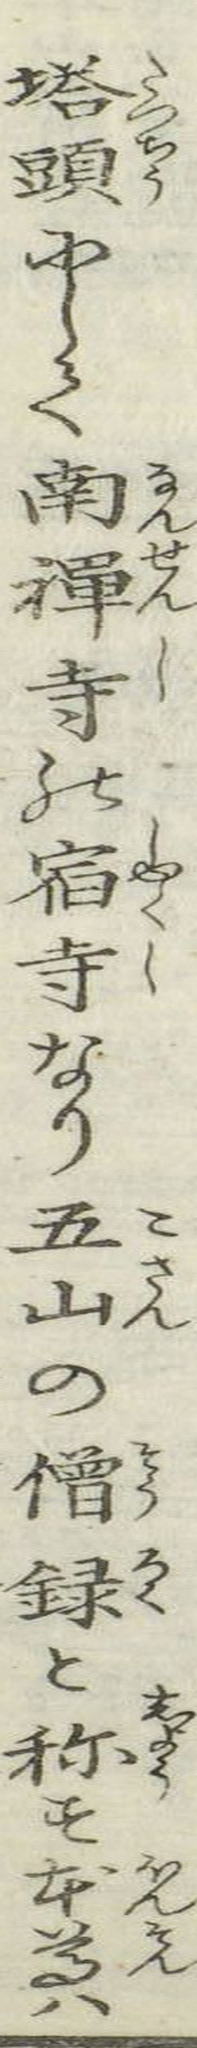塔頭にして南禅寺の宿寺なり五山の僧録と称す本尊は
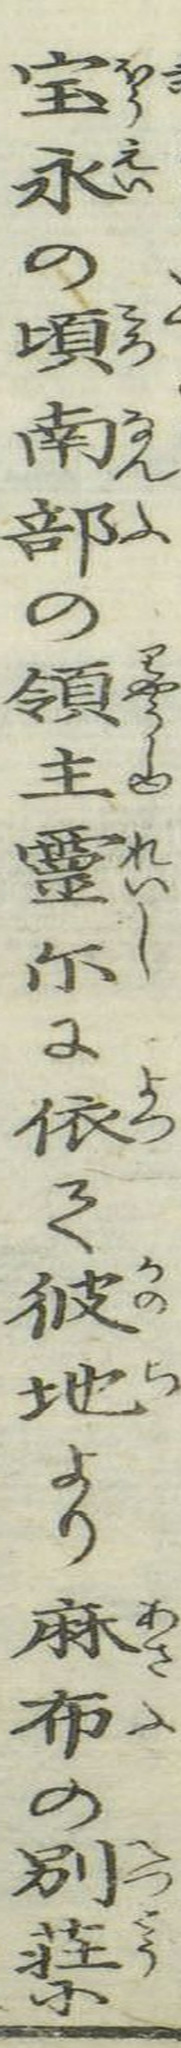宝永の頃南部の領主霊尓に依て彼地より麻布の別荘に
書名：江戸名所図会 20巻 巻之3
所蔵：東京学芸大学教育コンテンツアーカイブ
